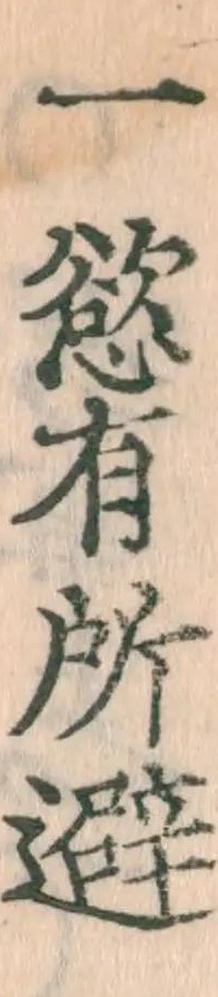一慾有所避
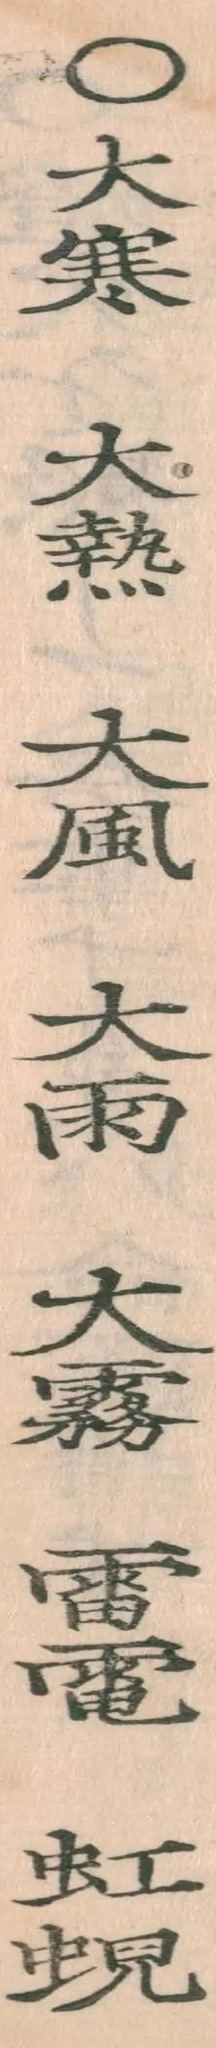〇大寒大熱大風大雨大霧雷電虹蜆
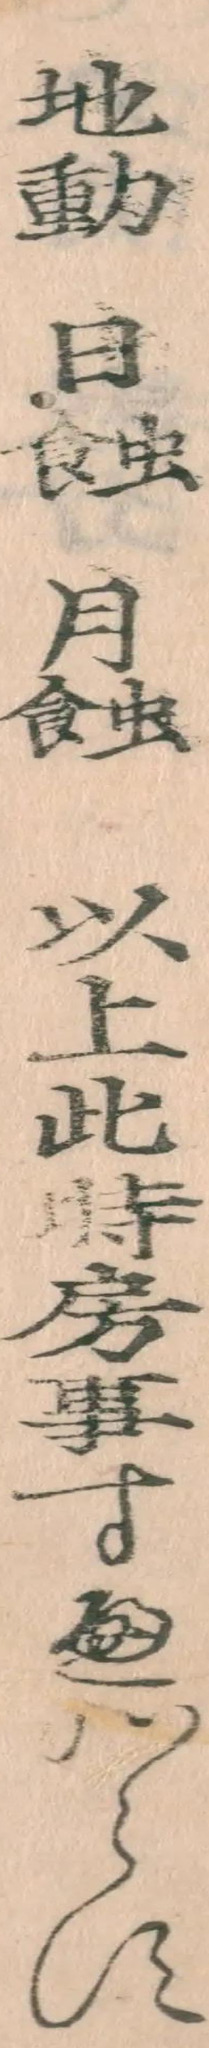地動日蝕月蝕以上此時房事すへからす
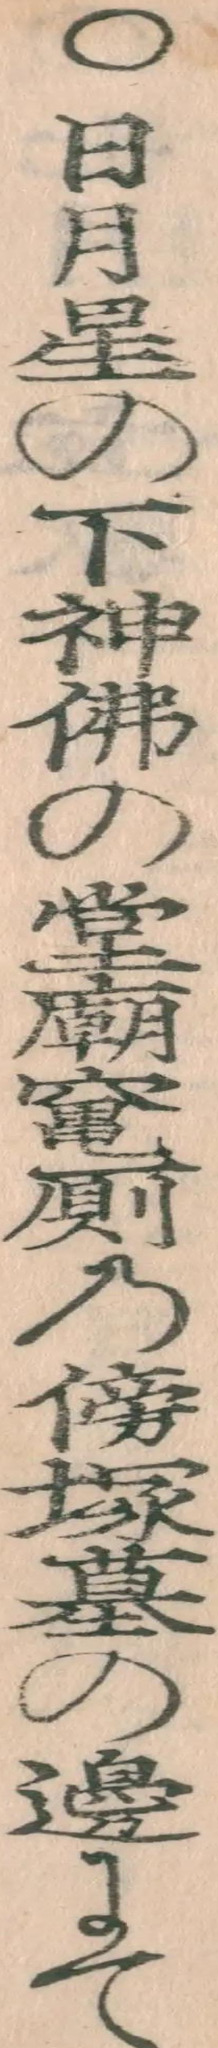〇日月星の下神仏の堂廟竃厠の傍塚墓の辺にて
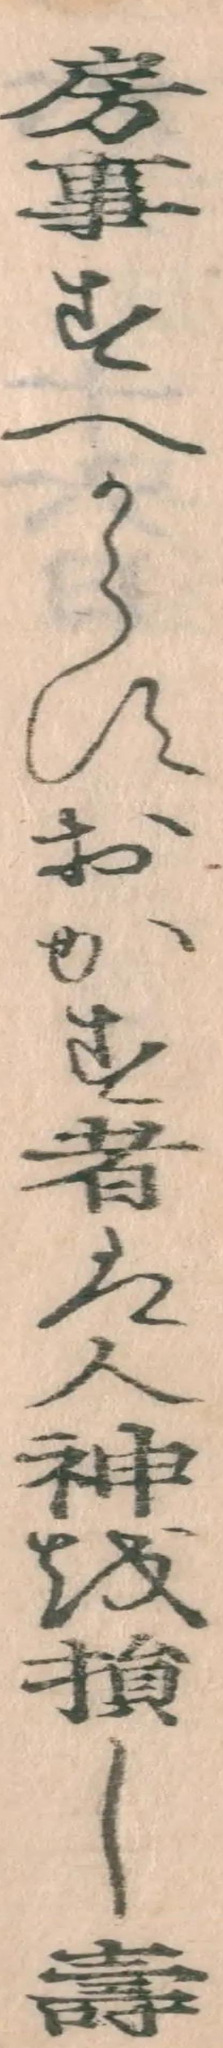房事すへからすおかす者は人神を損し寿
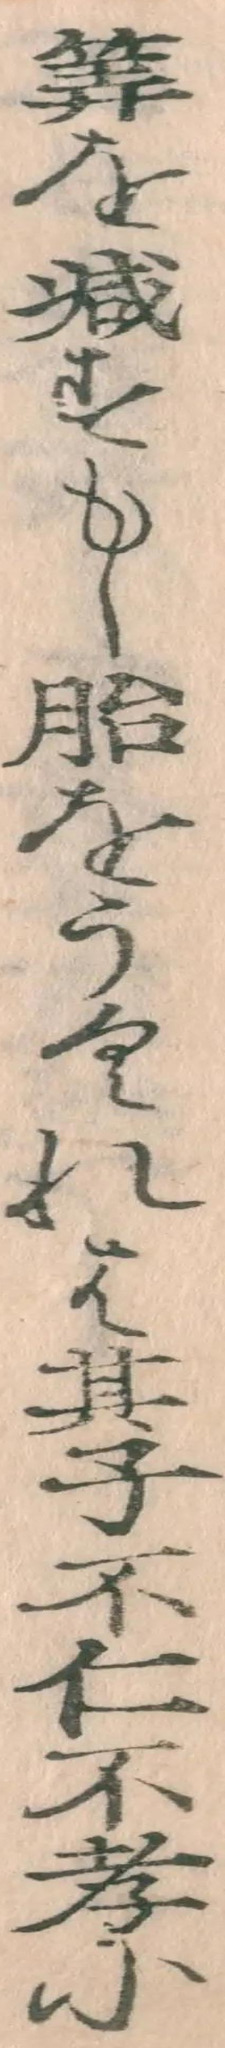算を減すもし胎をうけれは其子不仁不孝に
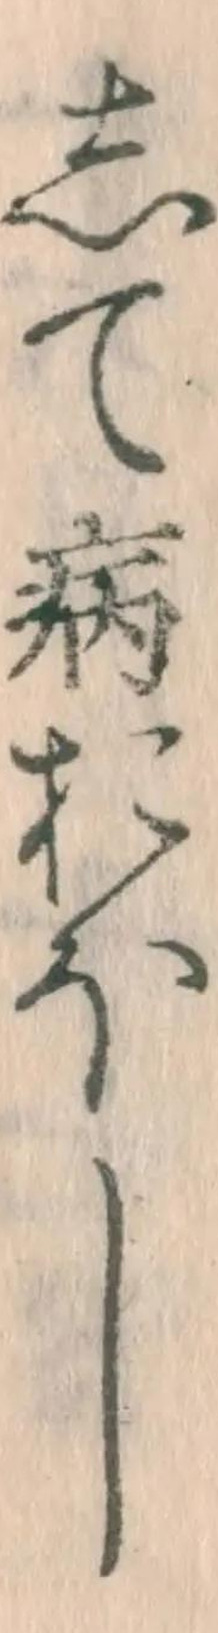して病おほし
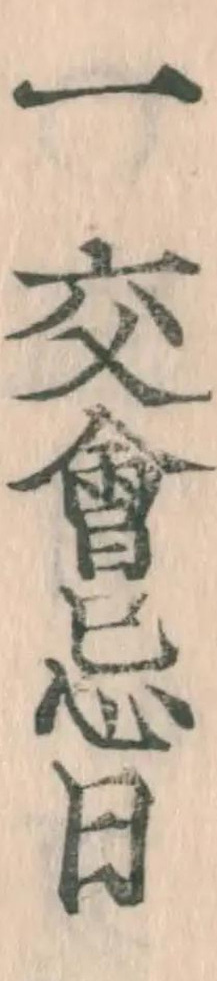一交会忌日
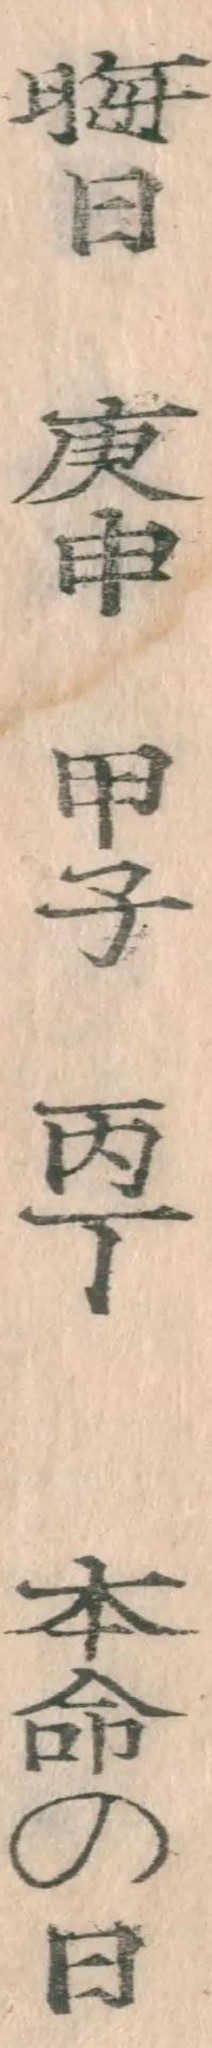晦日庚申甲子丙丁本命の日
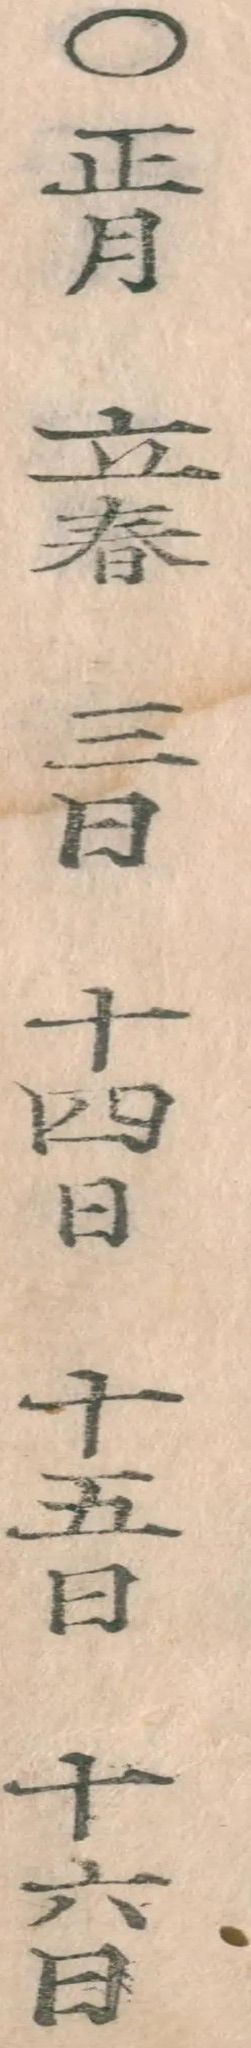〇正月立春三日十四日十五日十六日

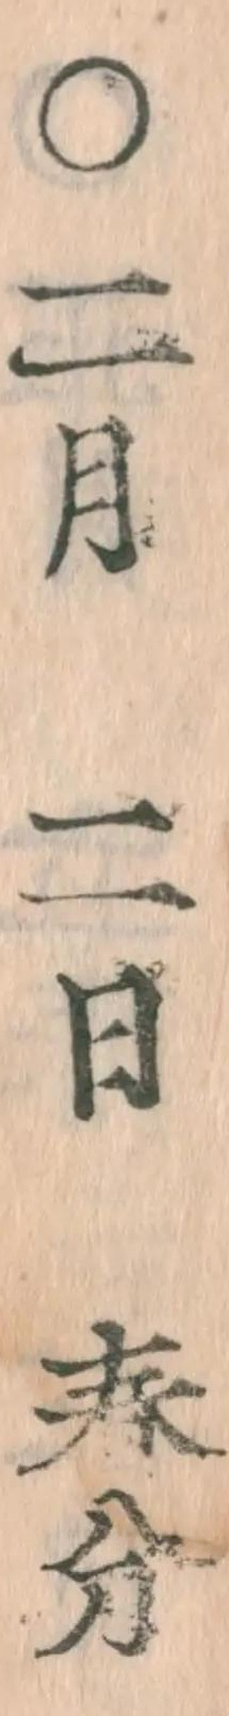〇二月二日春分
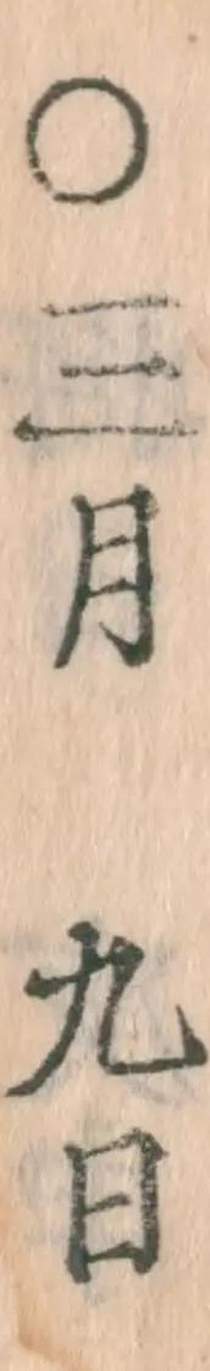〇三月九日
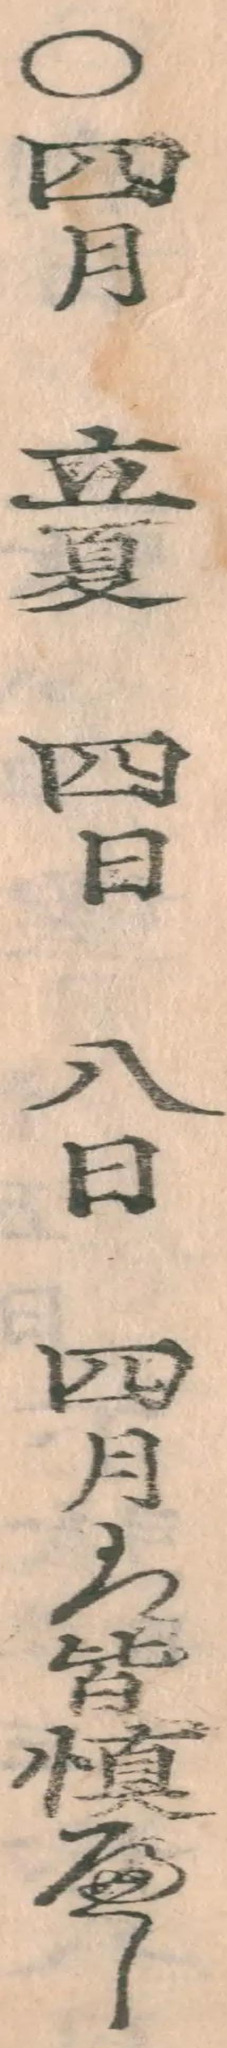〇四月立夏四日八日四月は皆慎へし
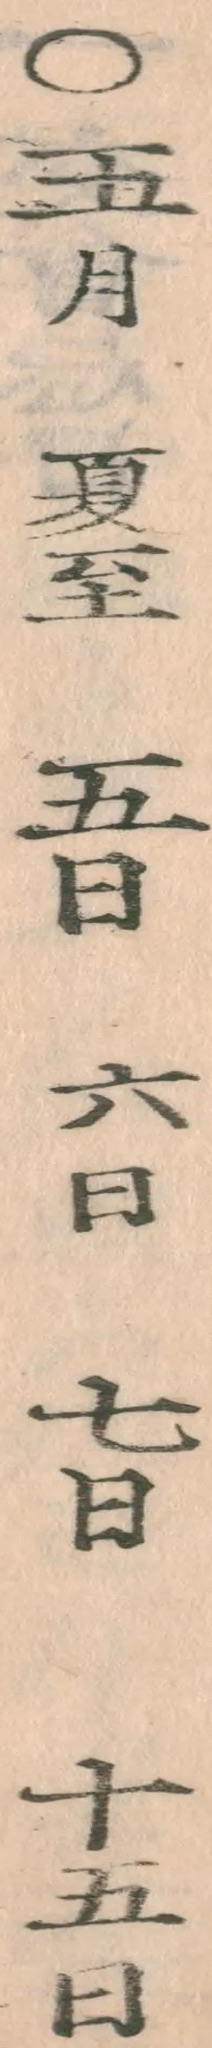〇五月夏至五日六日七日十五日
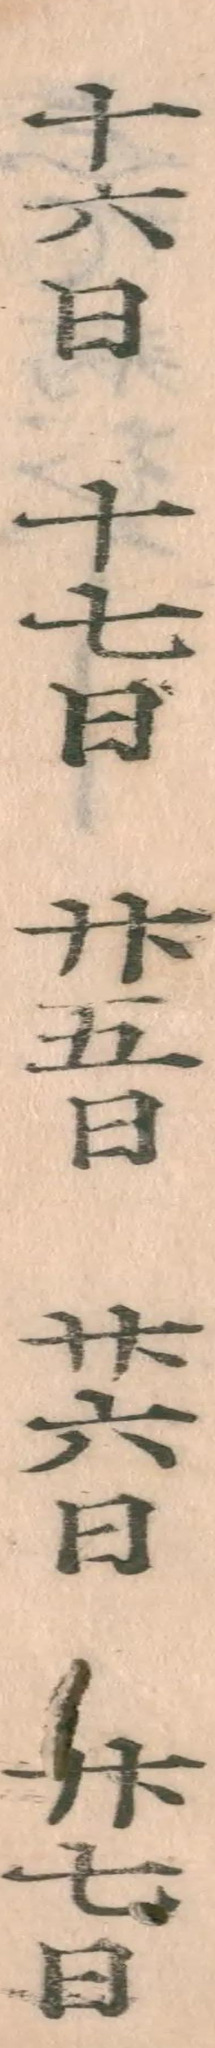十六日十七日廿五日廿六日廿七日
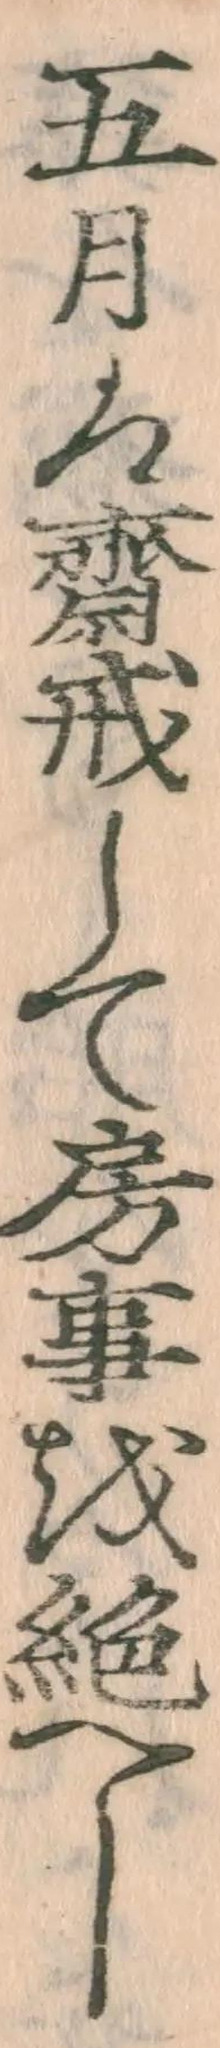五月は斎戒して房事を絶へし
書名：延壽撮要
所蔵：国立国会図書館 National Diet Library, JAPAN
